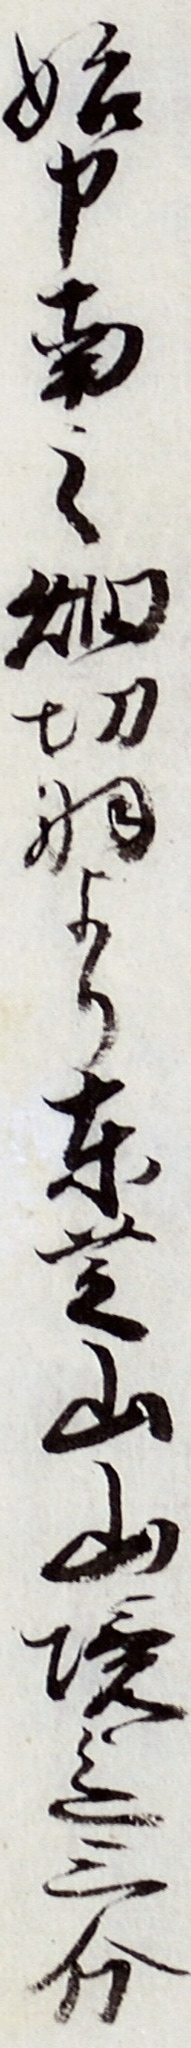始申南之畑切羽より東芝山山境迄三分
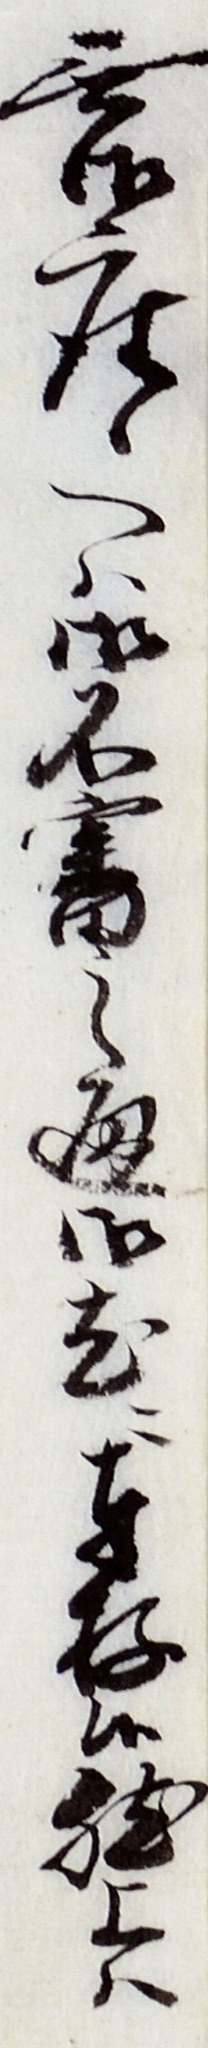無御座候ヘハ御不審之通御尤ニ奉存候然上ハ
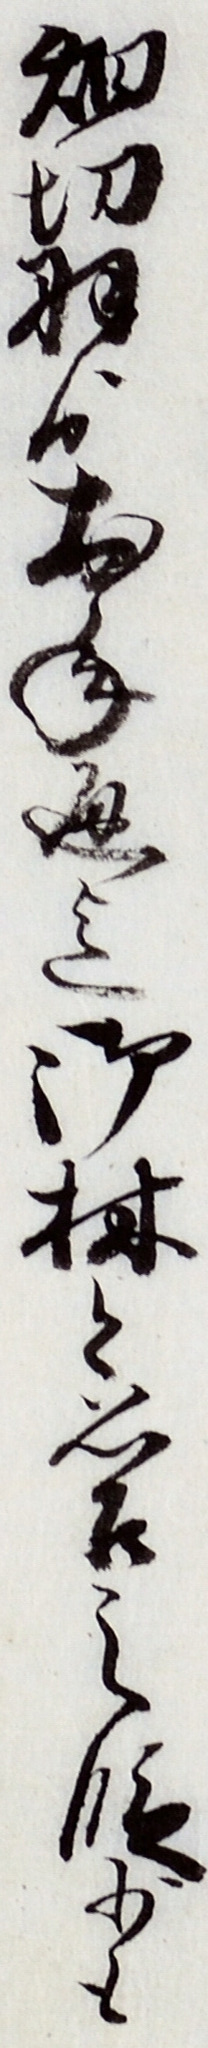畑切羽ゟおね通迄御林と思召之段少も
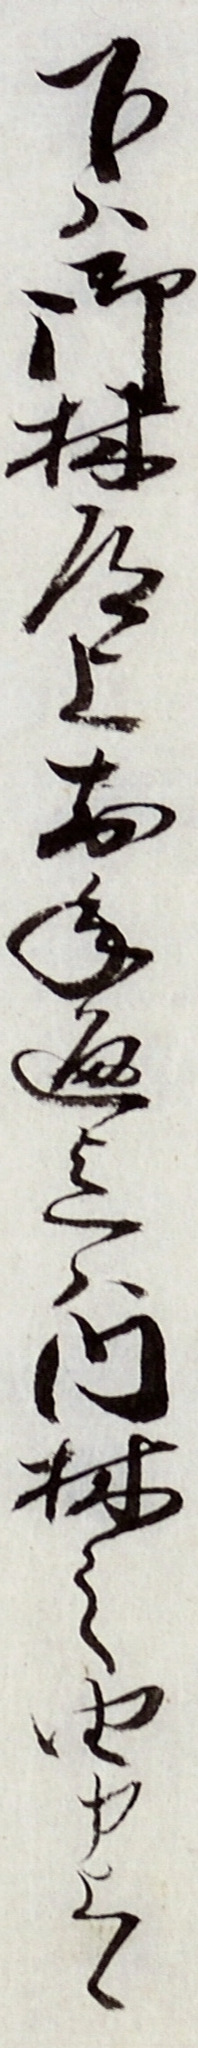下ハ御林道上おね通迄ハ内林之由申上候
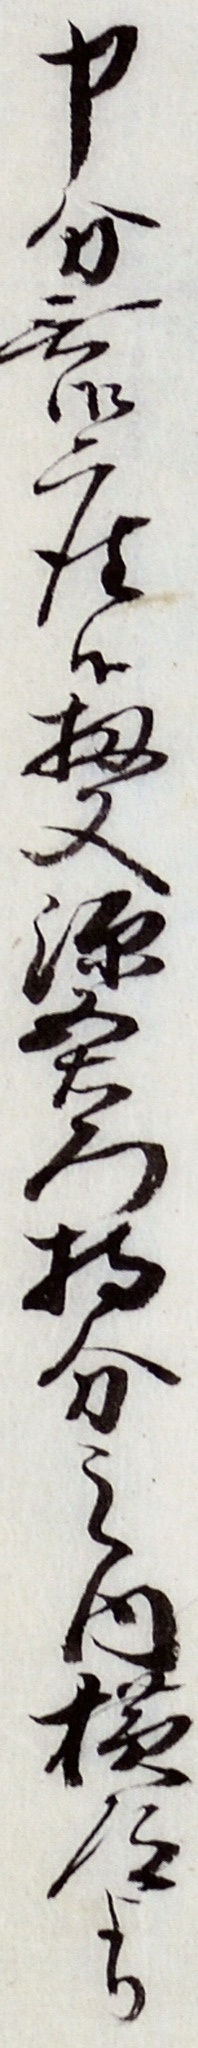申分無御座候扨又源五右衛門持分之内横道より
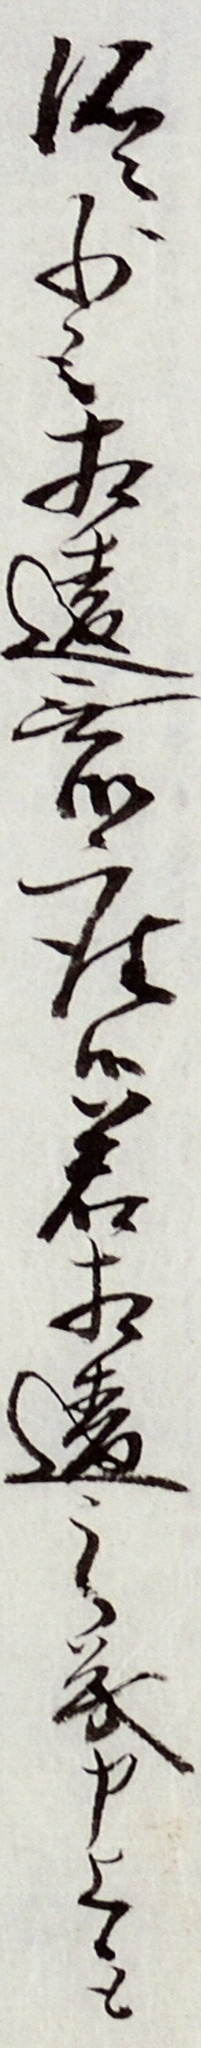所ニ少も相違無御座候若相違之義申上候も
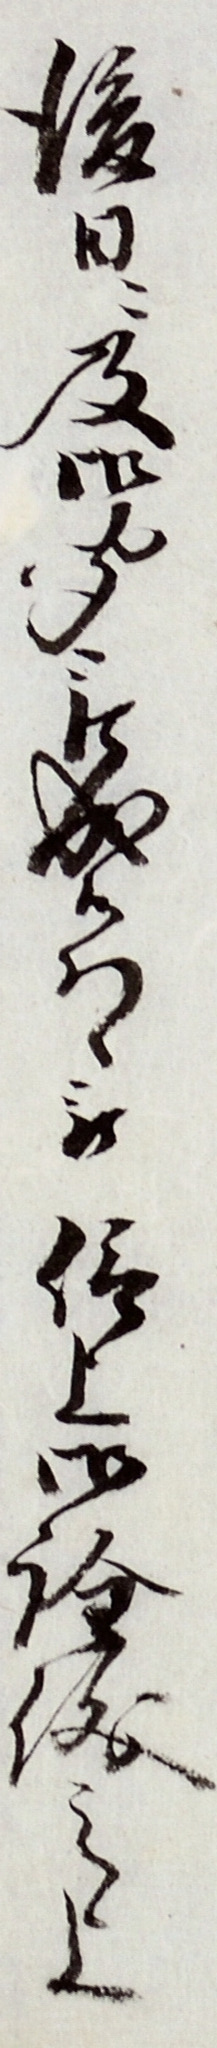後日ニ及御聞ニ被成候ハヽ被仰上御詮儀之上
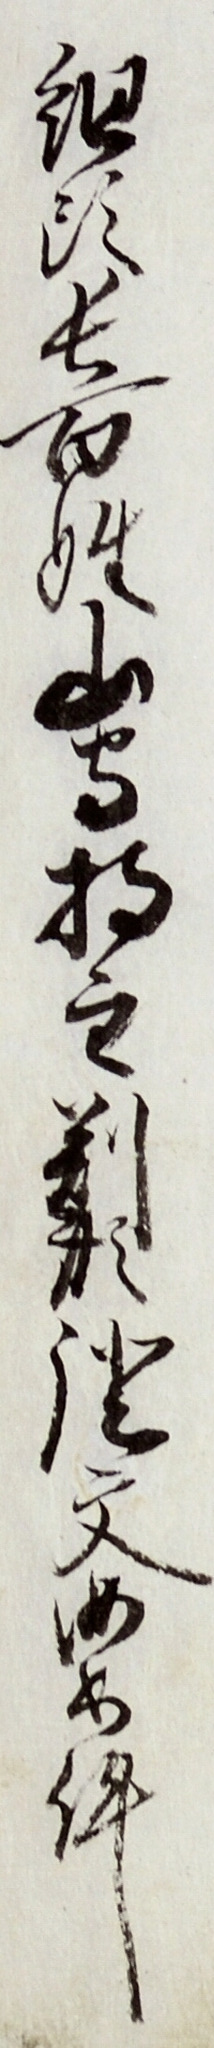組頭長百姓山守持主判形証文仍如件
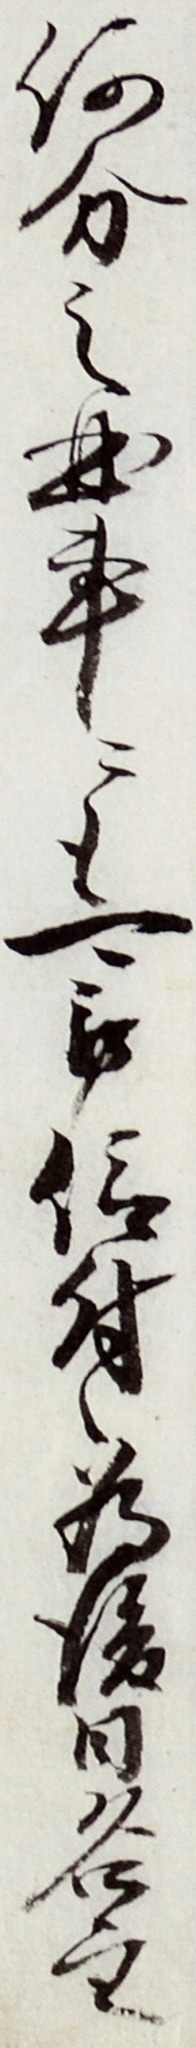何分之曲事ニも可被仰付候為後日名主

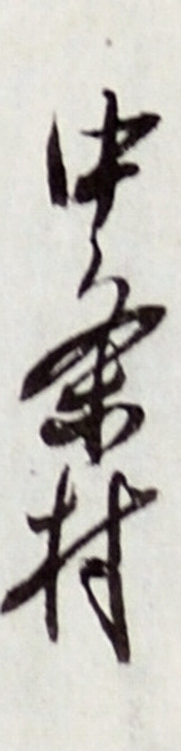中条村
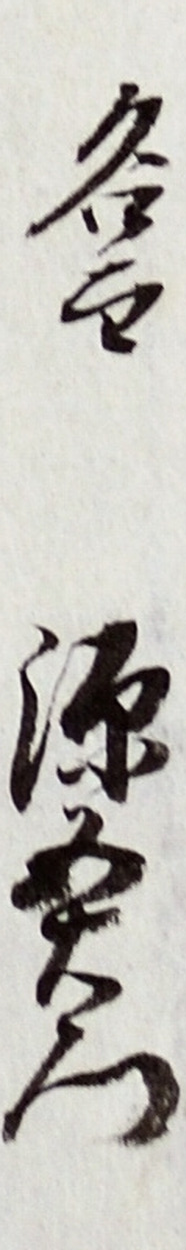名主源五右衛門
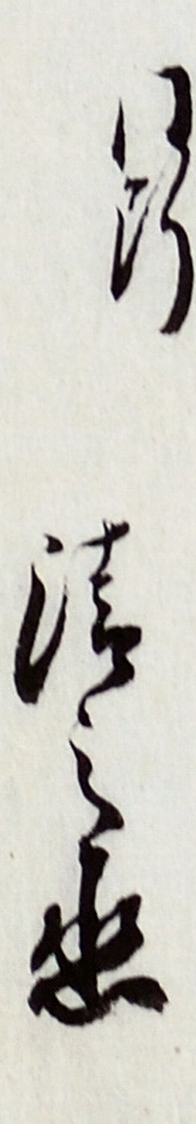同断清之丞
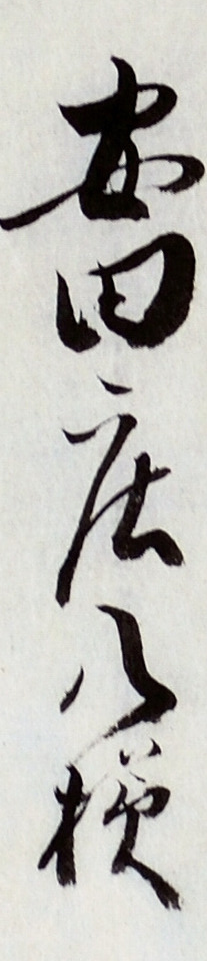安田庄八様
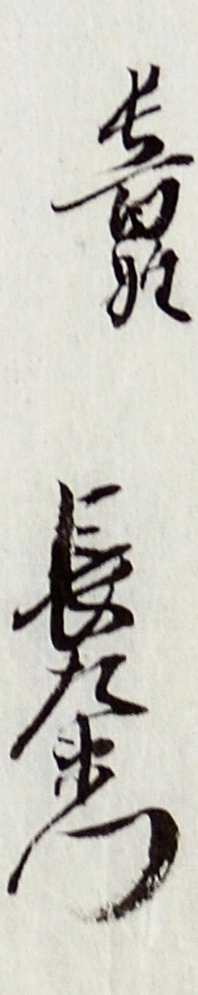長百姓長左衛門
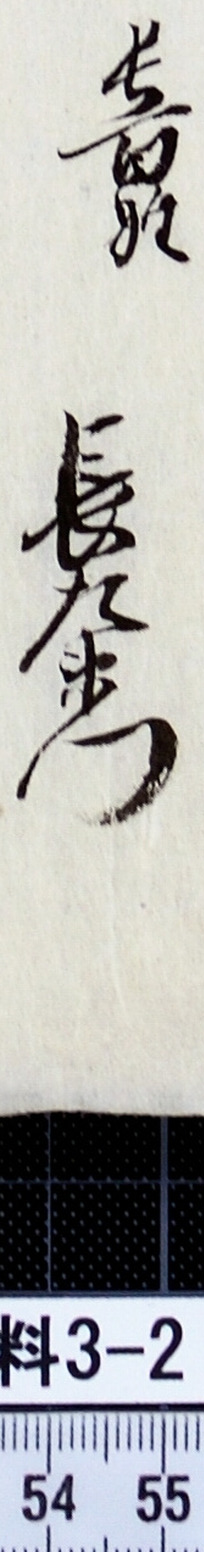長百姓長左衛門
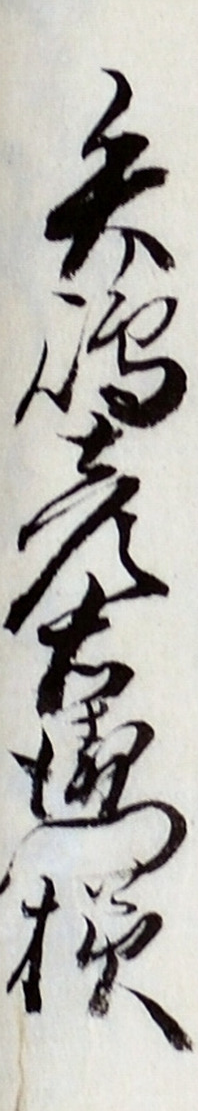矢嶋彦右衛門様
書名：御林御竹藪証文控
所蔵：伊那市立高遠町図書館・合同会社AMANE
